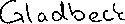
Gladbeck
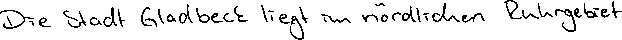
Die Stadt Gladbeck liegt im nördlichen Ruhrgebiet
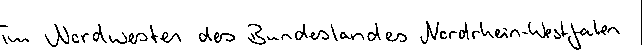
im Nordwesten des Bundeslandes Nordrhein-Westfalen
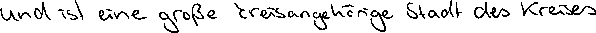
und ist eine große kreisangehörige Stadt des Kreises
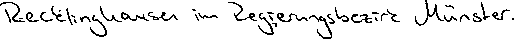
Recklinghausen im Regierungsbezirk Münster.
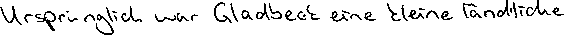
Ursprünglich war Gladbeck eine kleine ländliche
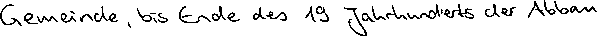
Gemeinde, bis Ende des 19. Jahrhunderts der Abbau
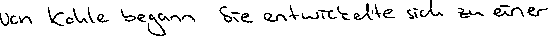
von Kohle begann. Sie entwickelte sich zu einer
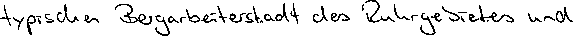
typischen Bergarbeiterstadt des Ruhrgebietes und
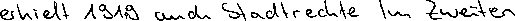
erhielt 1919 auch Stadtrechte. Im Zweiten
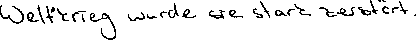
Weltkrieg wurde sie stark zerstört.
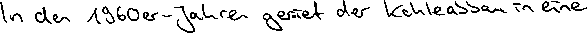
In den 1960er-Jahren geriet der Kohleabbau in eine
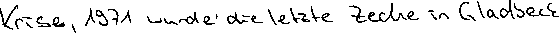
Krise, 1971 wurde die letzte Zeche in Gladbeck
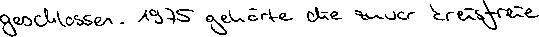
geschlossen. 1975 gehörte die zuvor kreisfreie
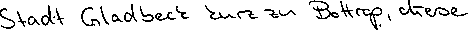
Stadt Gladbeck kurz zu Bottrop, diese
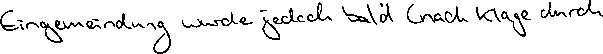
Eingemeindung wurde jedoch bald (nach Klage durch
